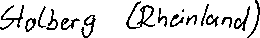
Stolberg (Rheinland)
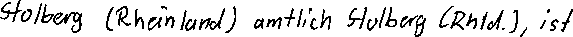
Stolberg (Rheinland) amtlich Stolberg (Rhld.), ist
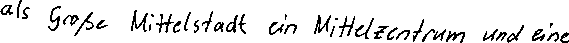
als Große Mittelstadt ein Mittelzentrum und eine
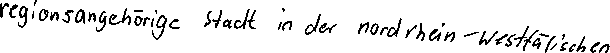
regionsangehörige Stadt in der nordrhein-westfälischen
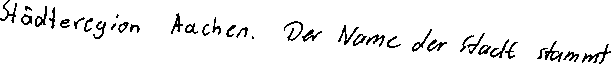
Städteregion Aachen. Der Name der Stadt stammt
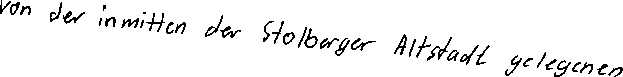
von der inmitten der Stolberger Altstadt gelegenen
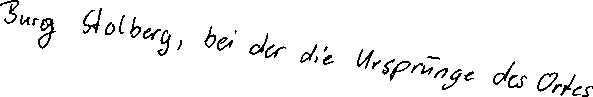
Burg Stolberg, bei der die Ursprünge des Ortes
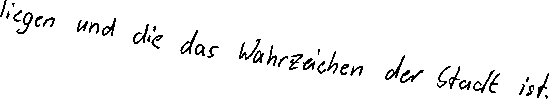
iegen und die das Wahrzeichen der Stadt ist.
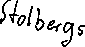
Stolberg
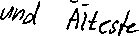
und Älteste
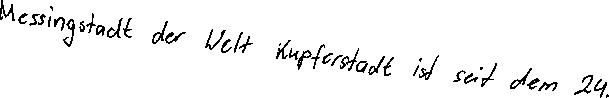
Messingstadt der Welt Kupferstadt ist seit dem 24.
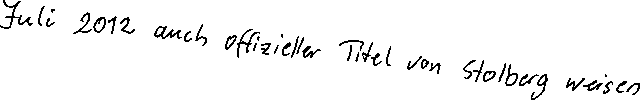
Juli 2012 auch offizieller Titel von Stolberg weisen
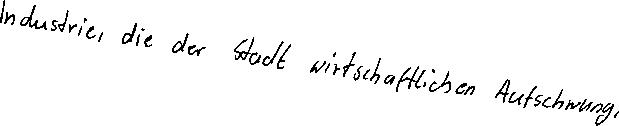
Industrie, die der Stadt wirtschaftlichen Aufschwung,
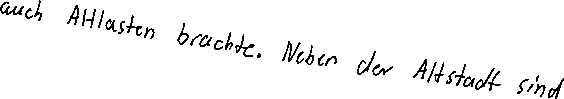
auch Altlasten brachte. Neben der Altstadt sind
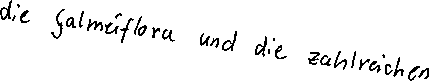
die Galmeiflora und die zahlreichen
